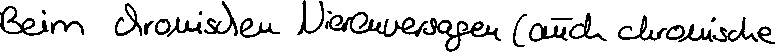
Beim chronischen Nierenversagen (auch chronische
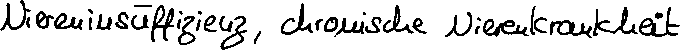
Niereninsuffizienz, chronische Nierenkrankheit
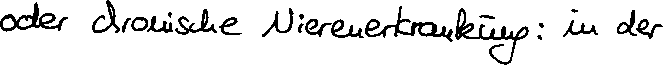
oder chronische Nierenerkrankung; in der
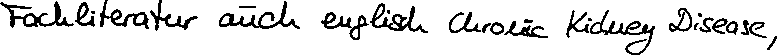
Fachliteratur auch englisch Chronic Kidney Disease,
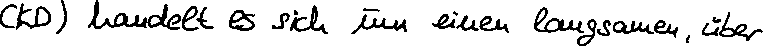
CKD) handelt es sich um einen langsamen, über
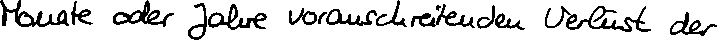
Monate oder Jahre voranschreitenden Verlust der
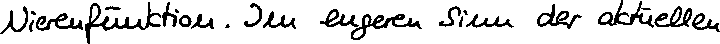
Nierenfunktion. Im engeren Sinn der aktuellen
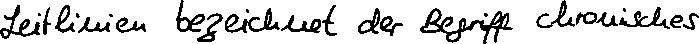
Leitlinien bezeichnet der Begriff chronisches
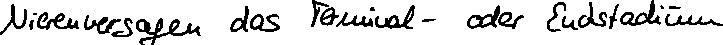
Nierenversagen das Terminal- oder Endstadium
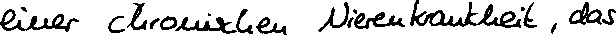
einer chronischen Nierenkrankheit, das
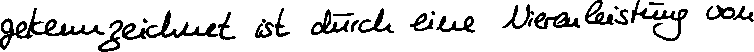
gekennzeichnet ist durch eine Nierenleistung von
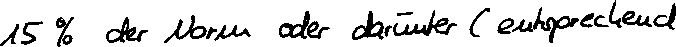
15 % der Norm oder darunter (entsprechend
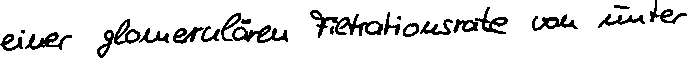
einer glomerulären Filtrationsrate von unter
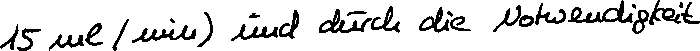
15 ml/min) und durch die Notwendigkeit
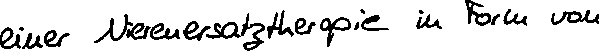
einer Nierenersatztherapie in Form von
